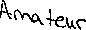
Amateur
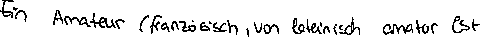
Ein Amateur (französisch, von lateinisch amator ist
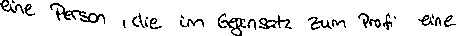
eine Person, die im Gegensatz zum Profi eine
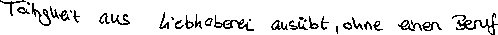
Tätigkeit aus Liebhaberei ausübt, ohne einen Beruf
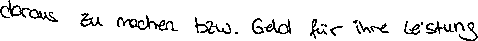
daraus zu machen bzw. Geld für ihre Leistung
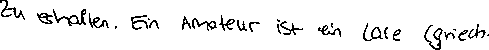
zu erhalten. Ein Amateur ist ein Laie (griech.
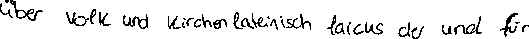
über Volk und kirchenlateinisch laicus der und für
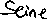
seine
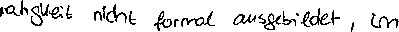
Tätigkeit nicht formal ausgebildet, im
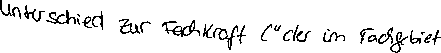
Unterschied zur Fachkraft ("der im Fachgebiet
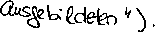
ausgebildeten").
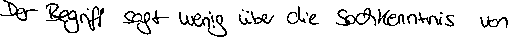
Der Begriff sagt wenig über die Sachkenntnis von
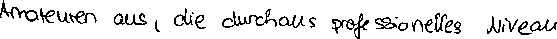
Amateuren aus, die durchaus professionelles Niveau
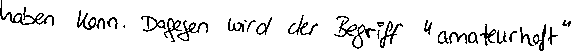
haben kann. Dagegen wird der Begriff "amateurhaft"
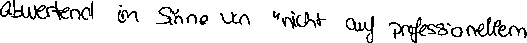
abwertend im Sinne von "nicht auf professionellem
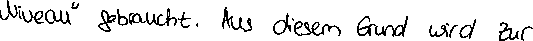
Niveau" gebraucht. Aus diesem Grund wird zur
